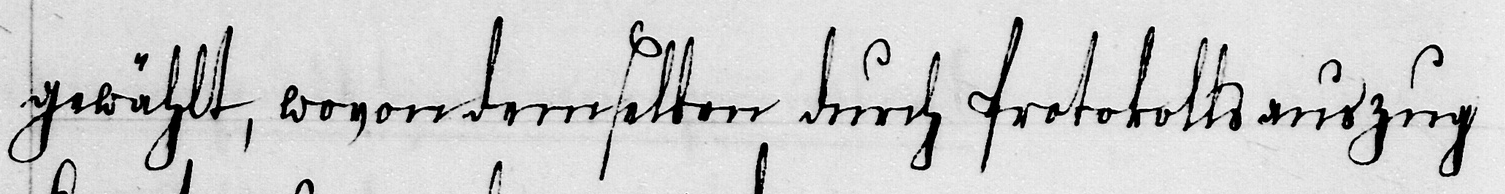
gewählt, wovon demselben durch Protokollsauszug
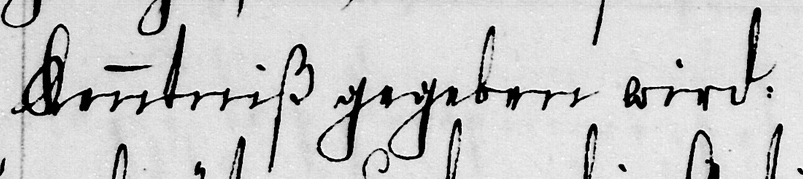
Kenntniß gegeben wird.
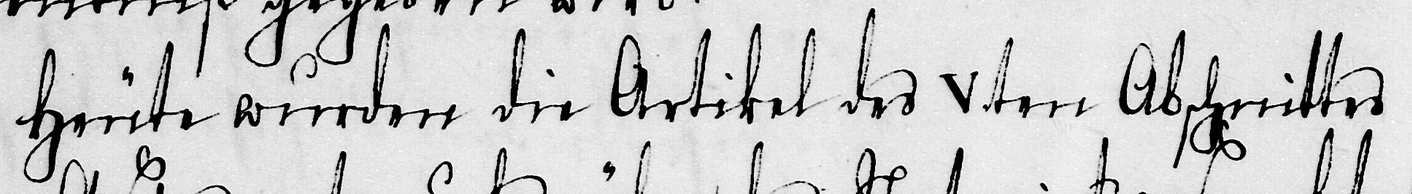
Heute wurden die Artikel des Vten Abschnittes
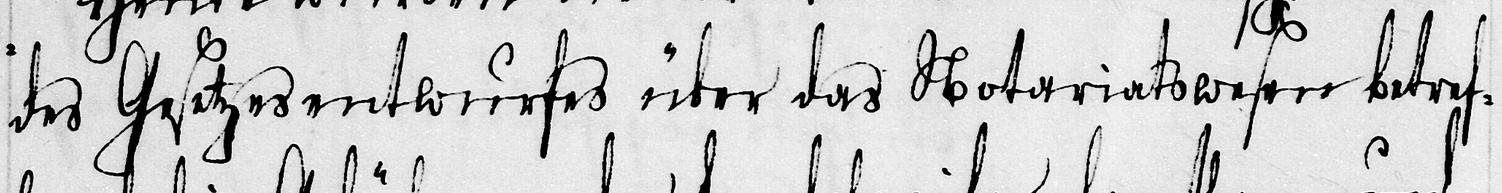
des Gesetzesentwurfes über das Notariatswesen betref¬
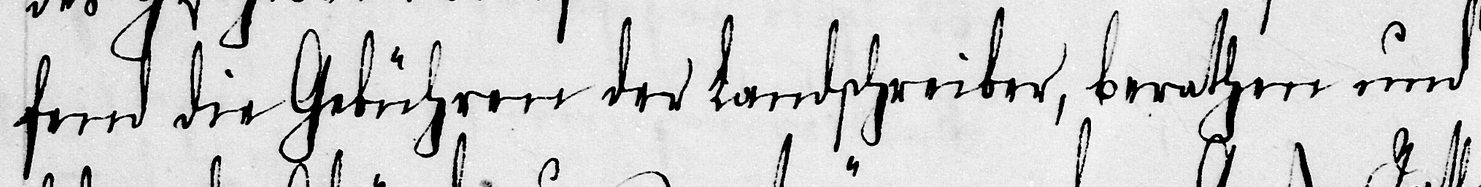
fend die Gebühren der Landschreiber, berathen und
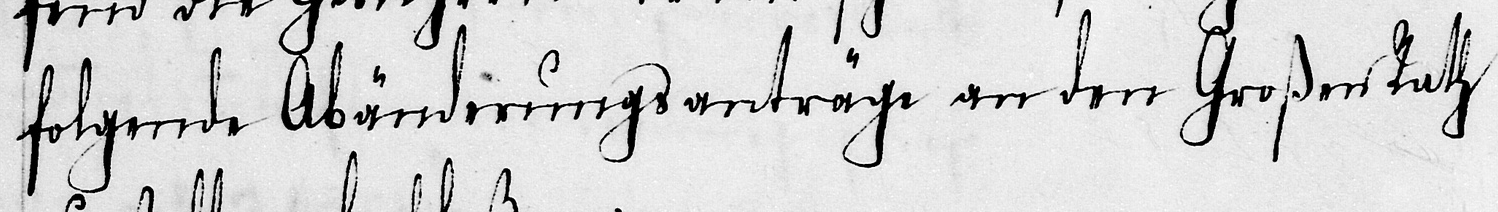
folgende Abänderungsanträge an den Großen Rath
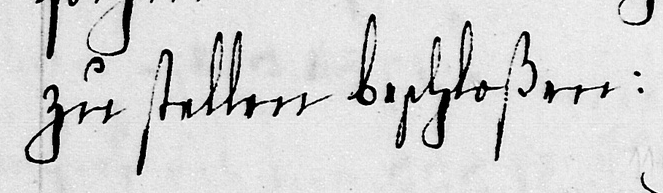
zu stellen beschloßen:
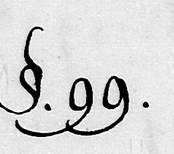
§. 99.
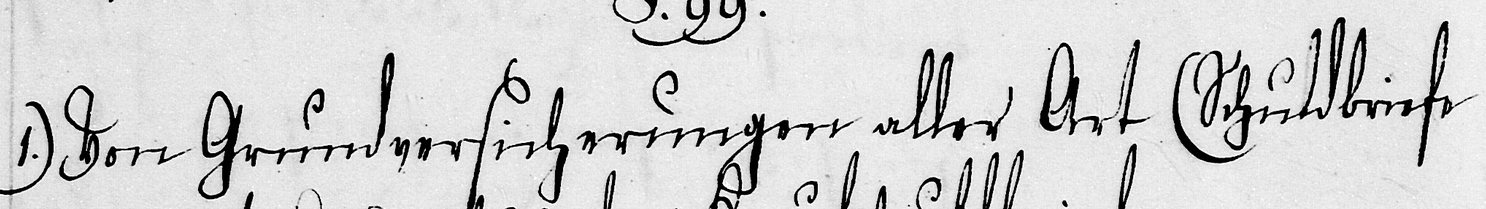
1.) Von Grundversicherungen aller Art (Schuldbriefe
